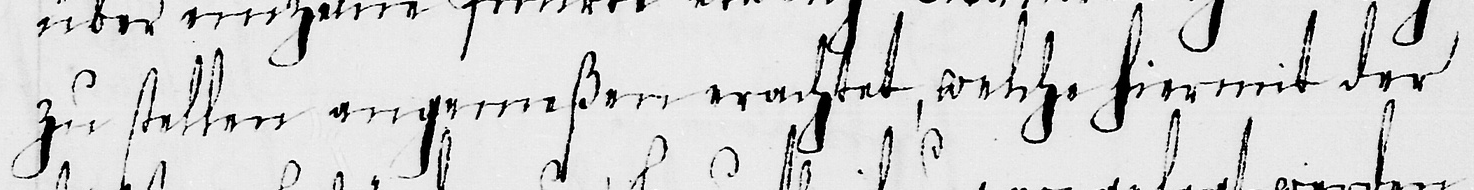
zu stellen angemeßen erachtet, welche hiermit der
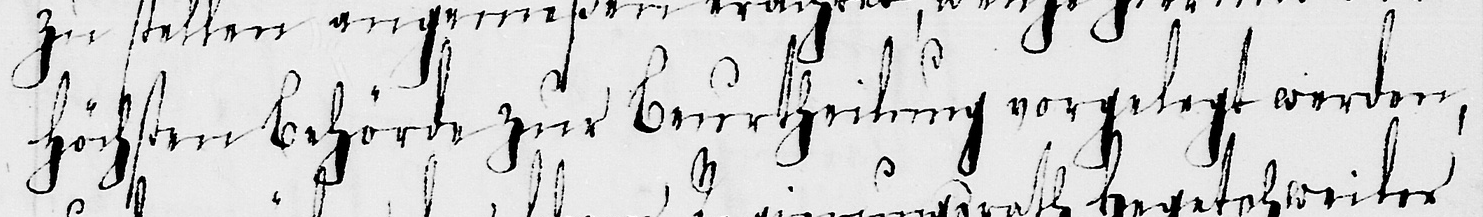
Höchsten Behörde zur Beurtheilung vorgelegt werden,
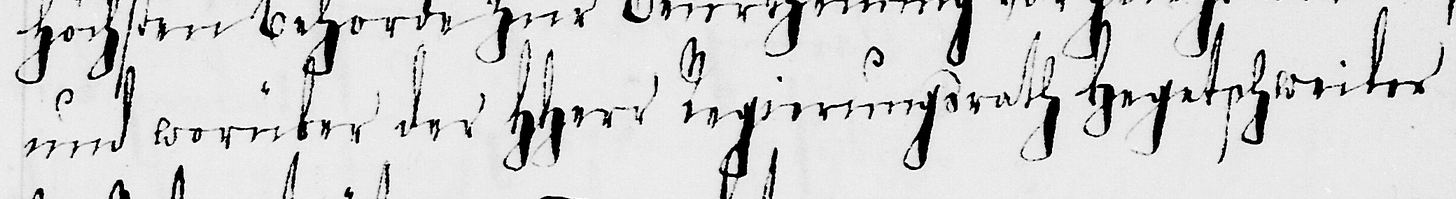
und worüber der HHerr Regierungsrath Hegetschweiler
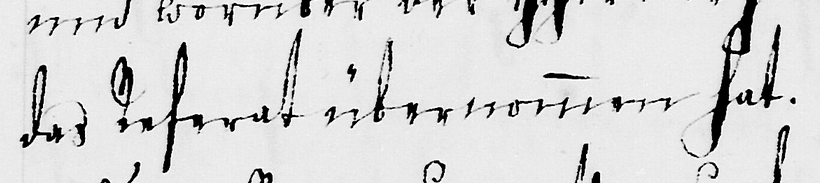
das Referat übernommen hat.
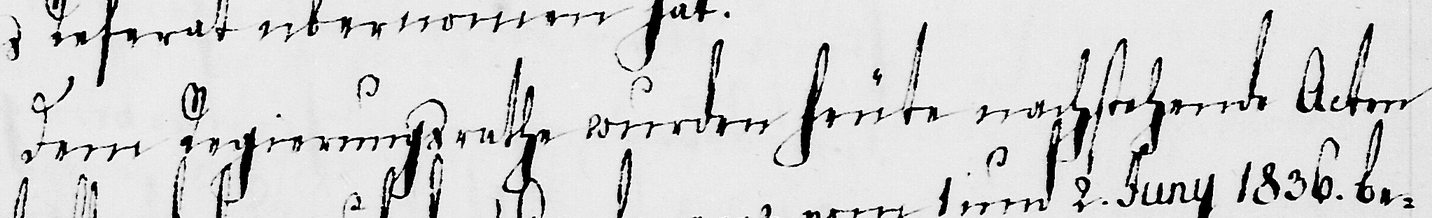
Dem Regierungsrathe wurden heute nachstehende Acten
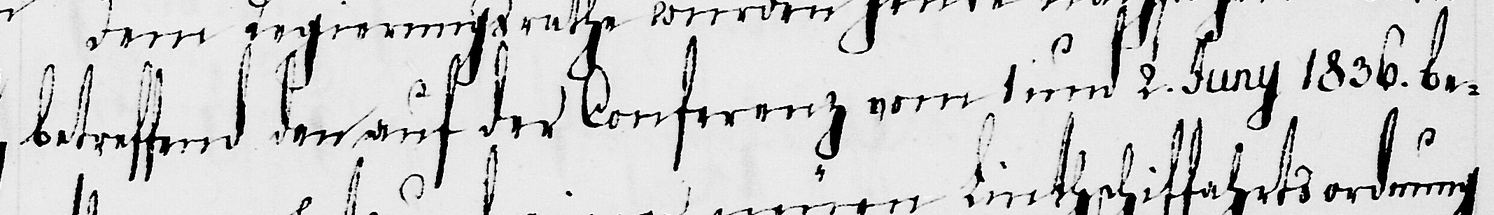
betreffend den auf der Conferenz vom 1 und 2. Juny 1836. be¬
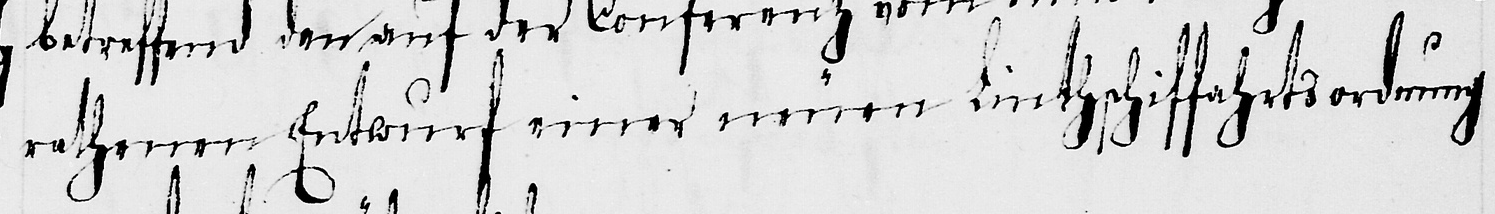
rathenen Entwurf einer neuen Linthschiffahrtsordnung
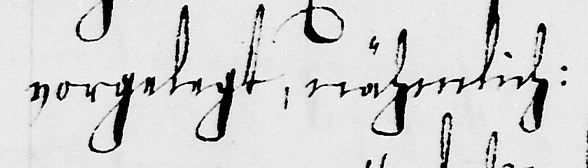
vorgelegt, nämlich:
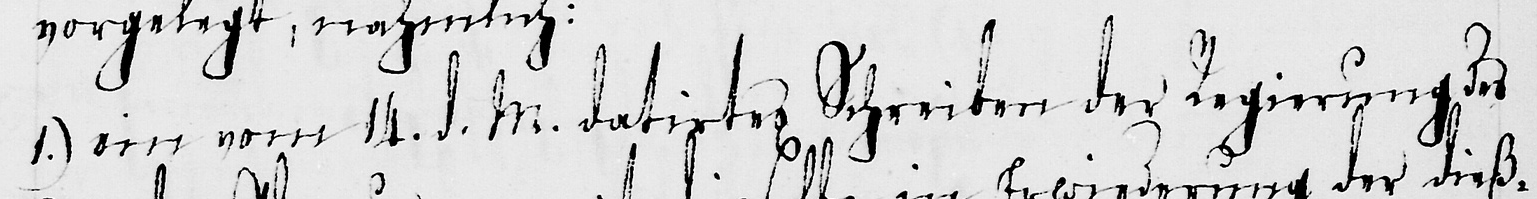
1.) ein vom 14. d. M. datirtes Schreiben der Regierung des
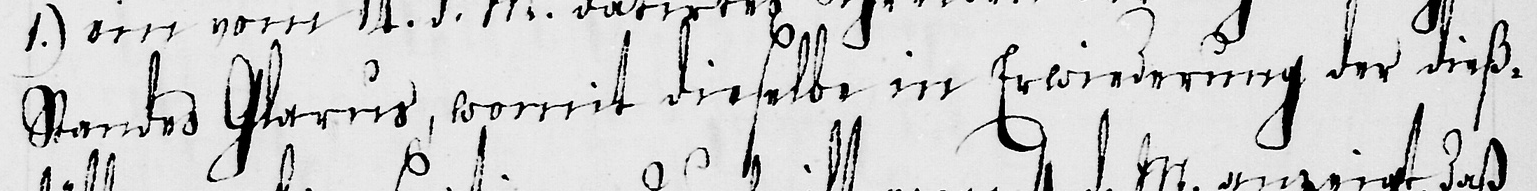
Standes Glarus, womit dieselbe in Erwiederung der dieß¬
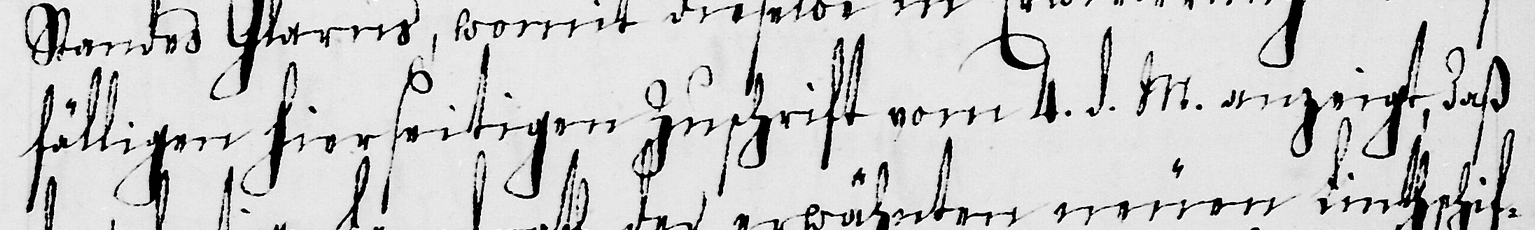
fälligen hierseitigen Zuschrift vom 4. d. M. anzeigt, daß
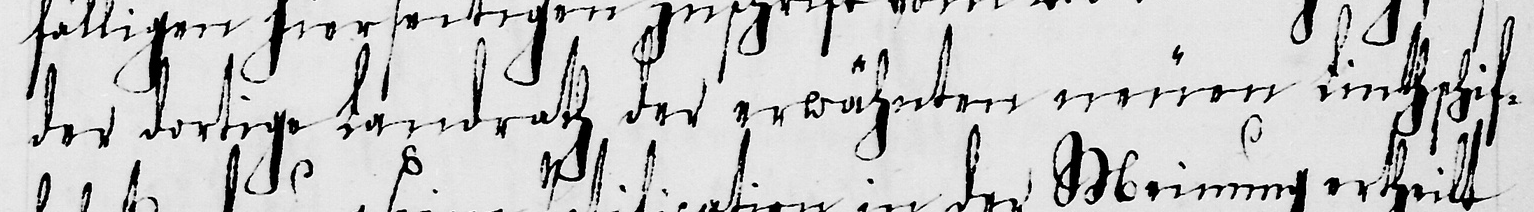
der dortige Landrath der erwähnten neuen Linthsch¬
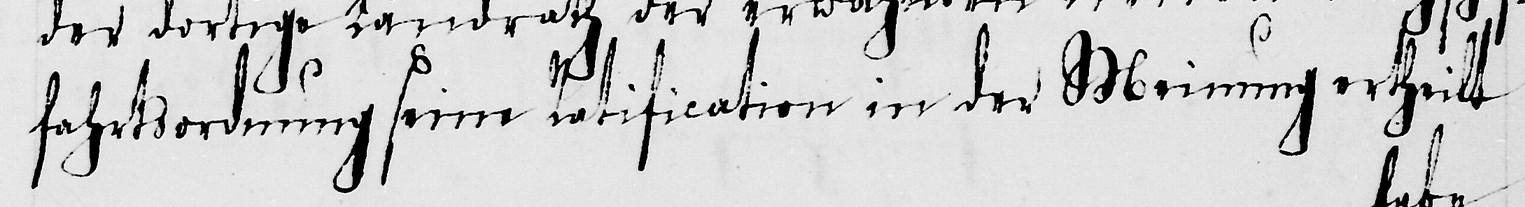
fahrtsordnung seine Ratification in der Meinung ertheilt
